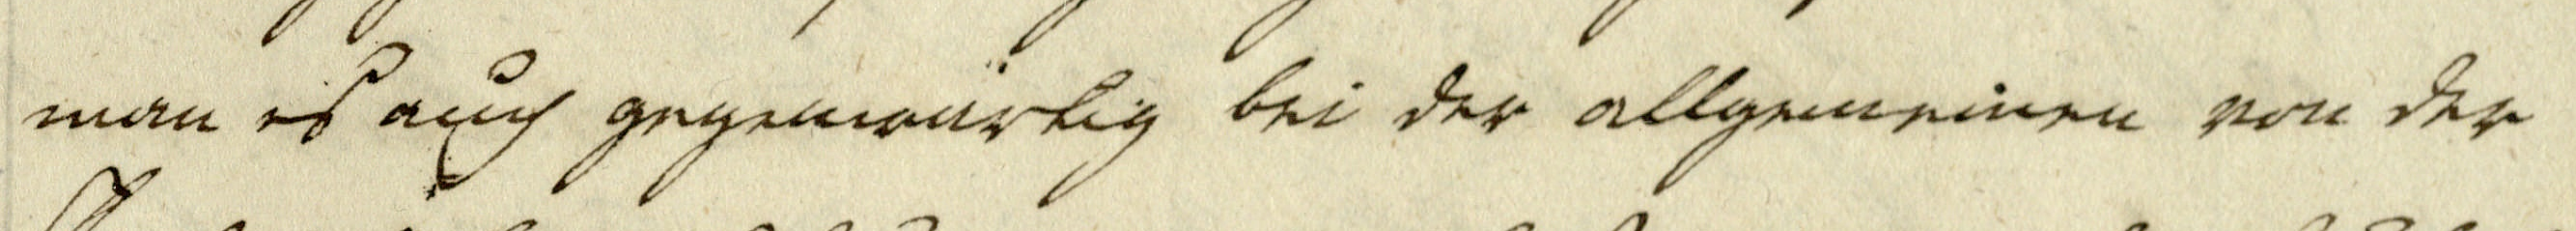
man es auch gegenwärtig bei der allgemeinen von der
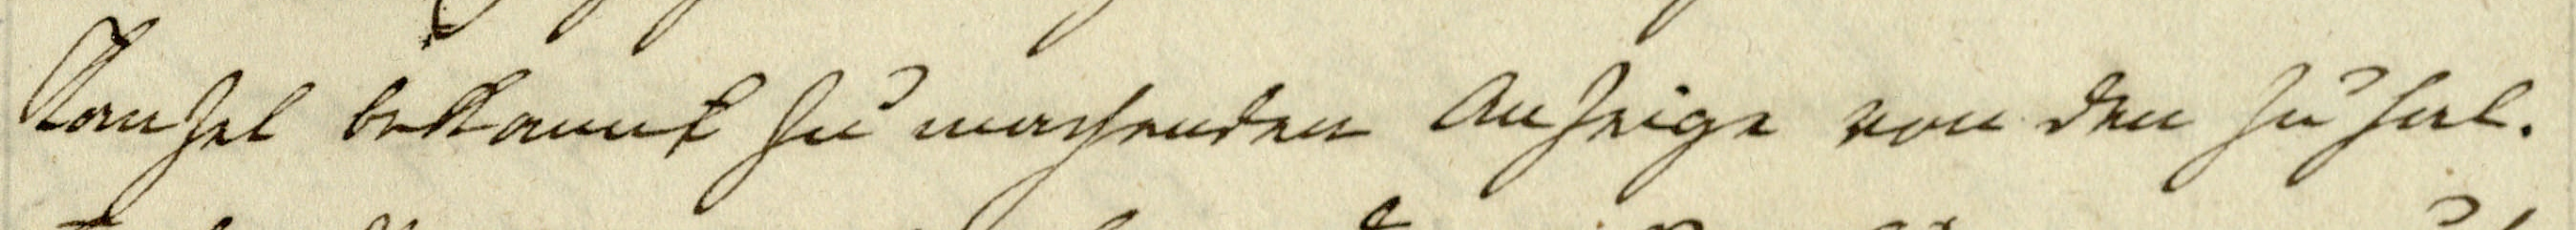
Kanzel bekannt zu machenden Anzeige von dem zu hal¬
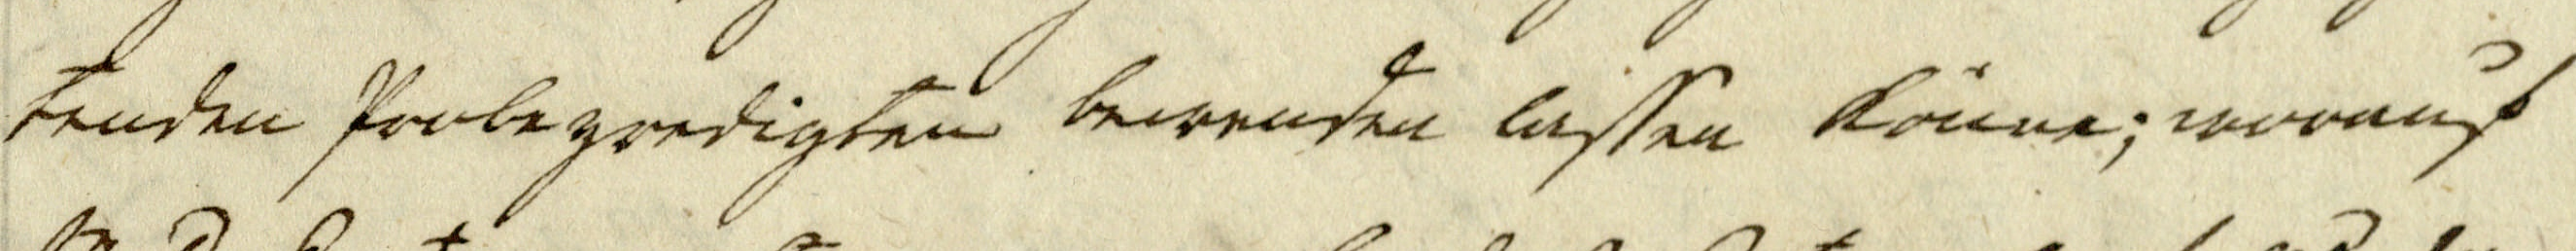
tenden Probepredigten Bewenden lassen könne; worauf
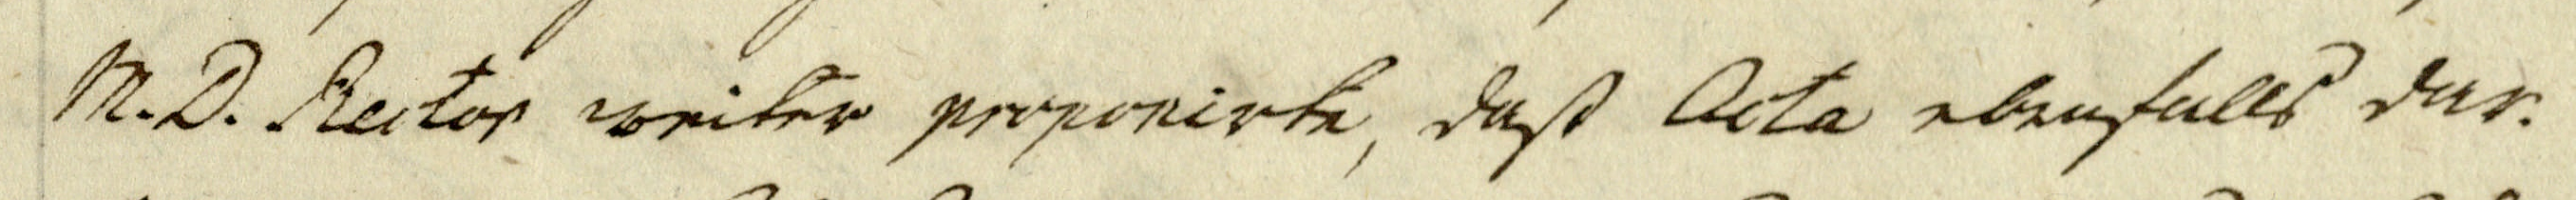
M. D. Rector weiter proponirte, daß Acta ebenfalls dar¬
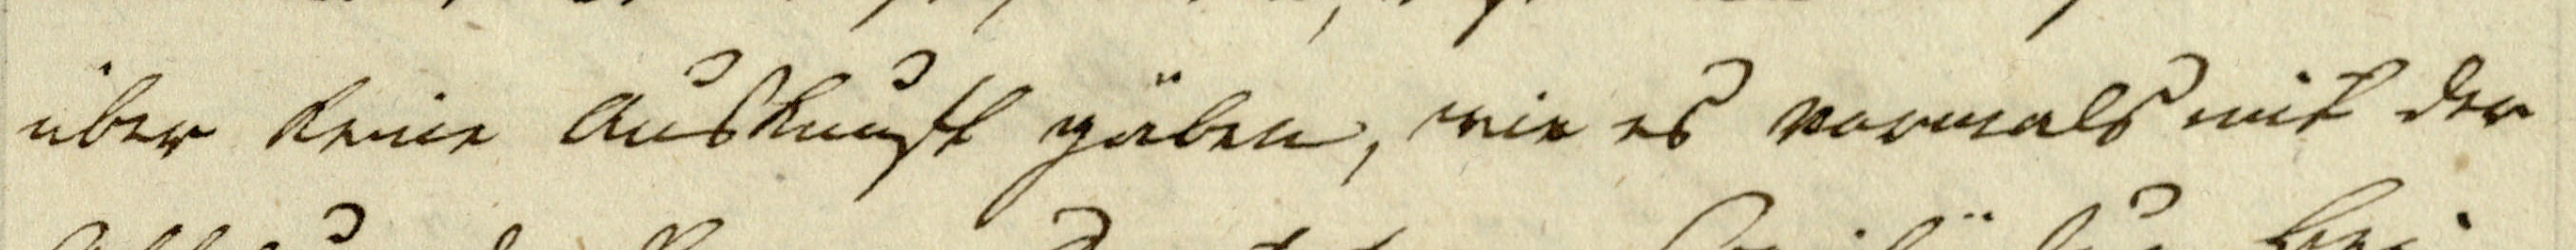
über keine Auskunft gäben, wie es vormals mit der
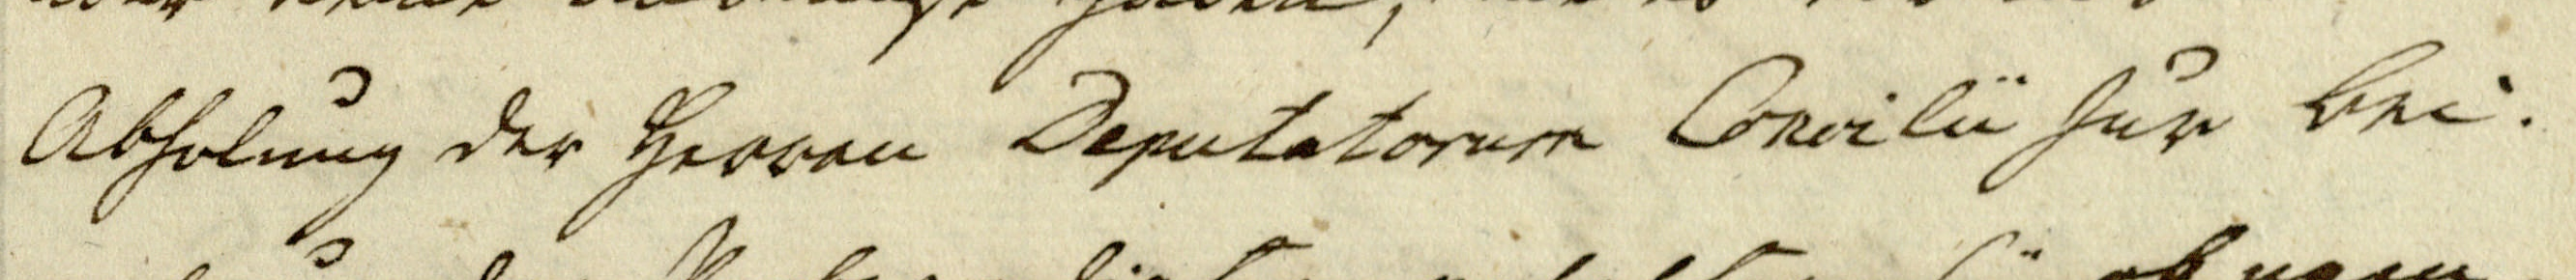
Abholung der Herren Deputatorum Concilii zur Bei¬
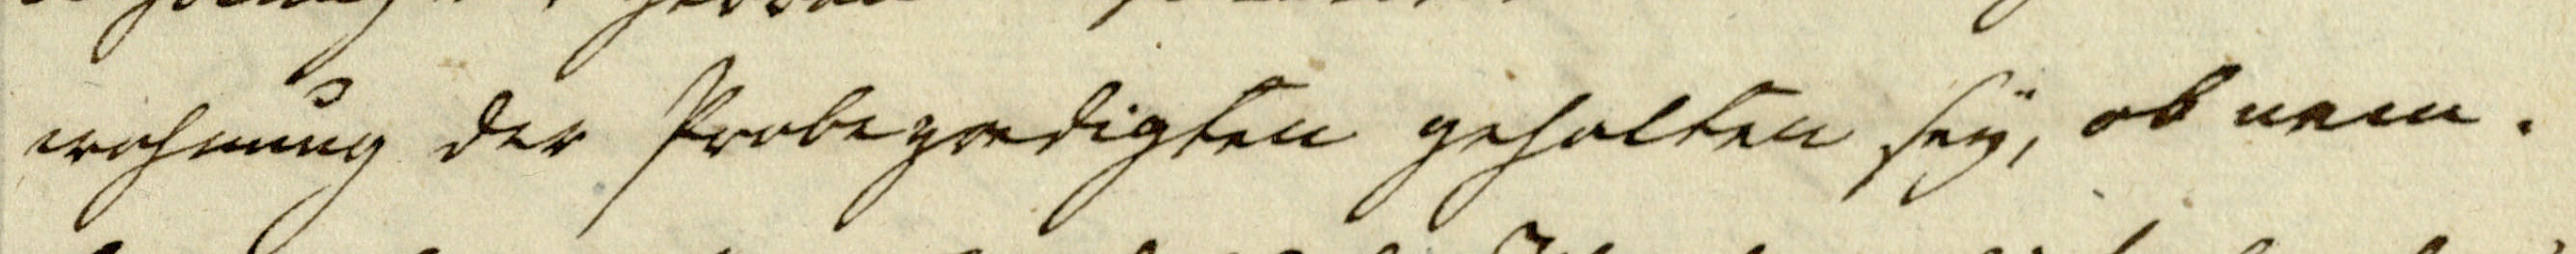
wohnung der Probepredigten gehalten seÿ, ob nem¬
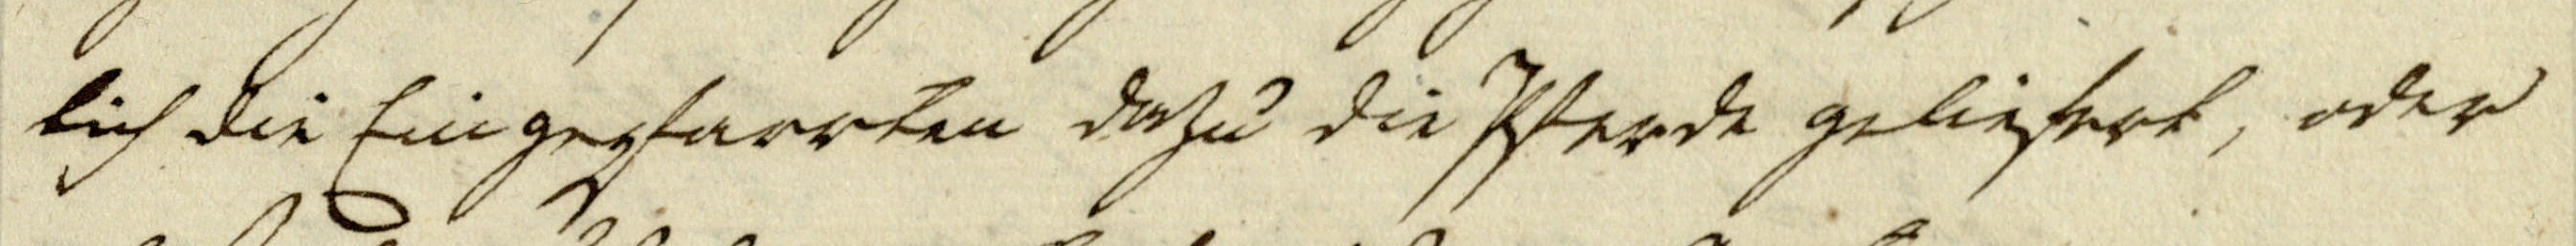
lich die Eingepfarrten dazu die Pferde geliefert, oder
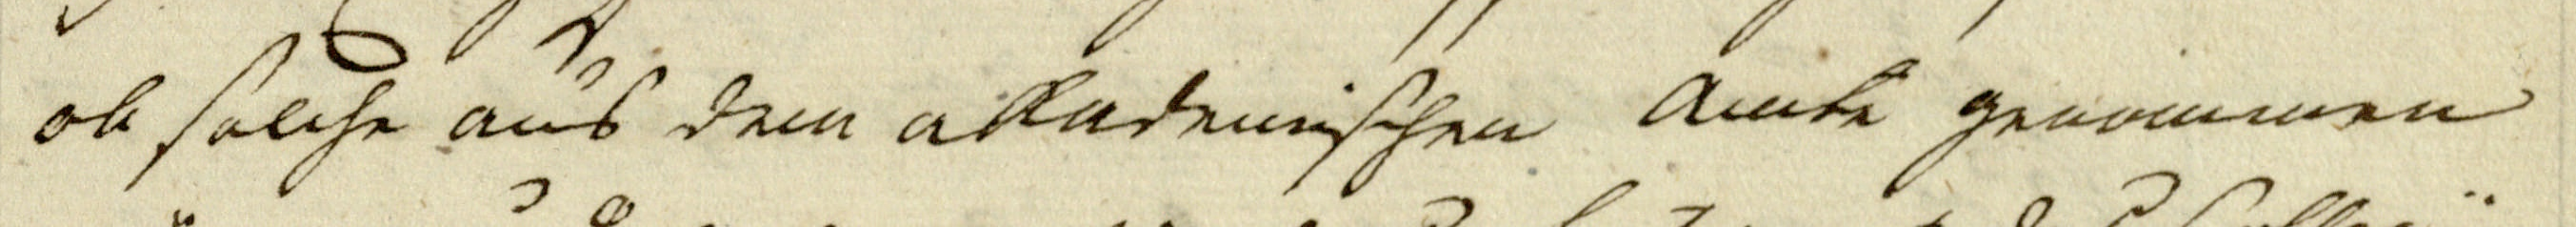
ob solche aus dem akademischen Amte genommen
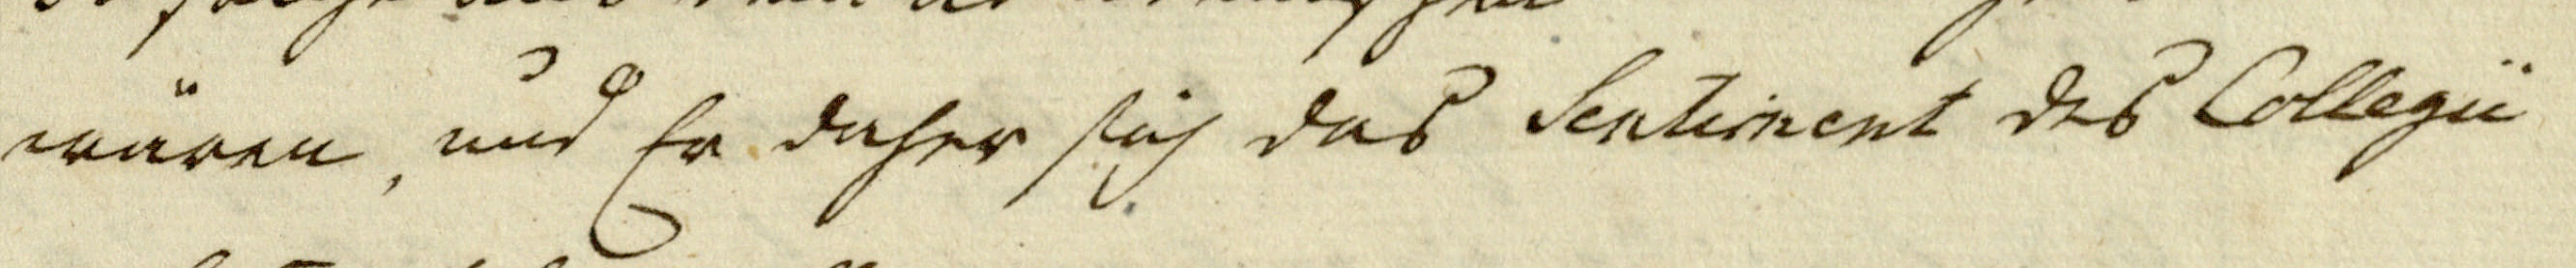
wären, und Er daher sich das Sentiment des Collegii
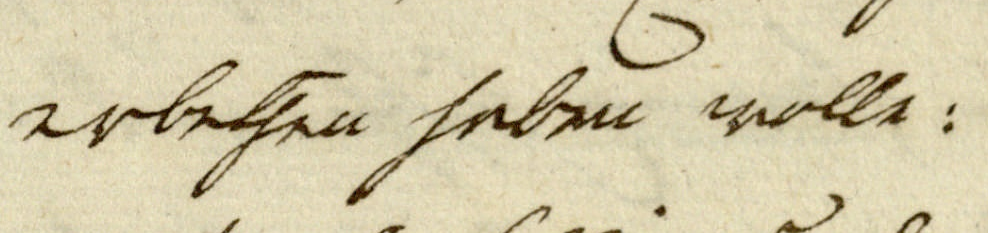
erbethen haben wolle:
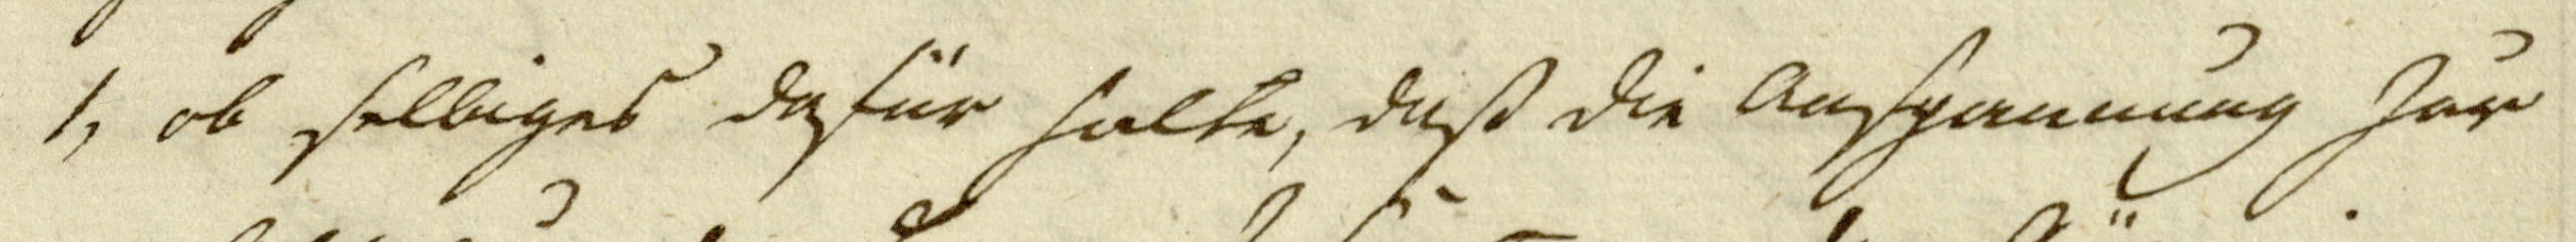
1, ob selbiges dafür halte, daß die Anspannung zur
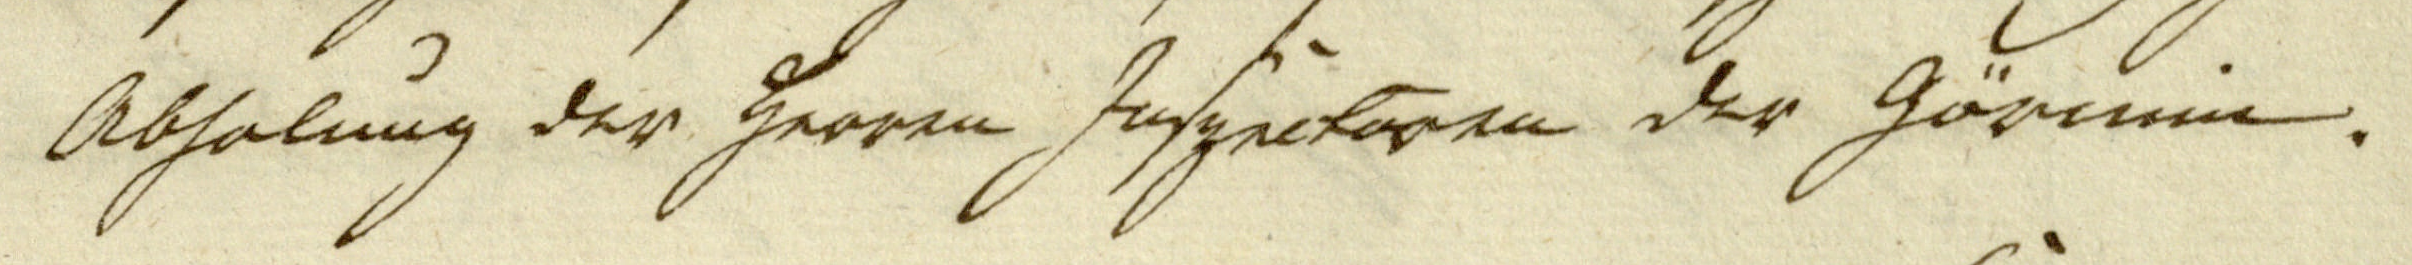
Abholung der Herren Inspectoren der Görmin¬
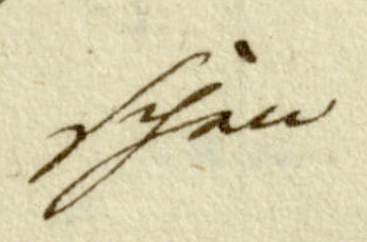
schen
